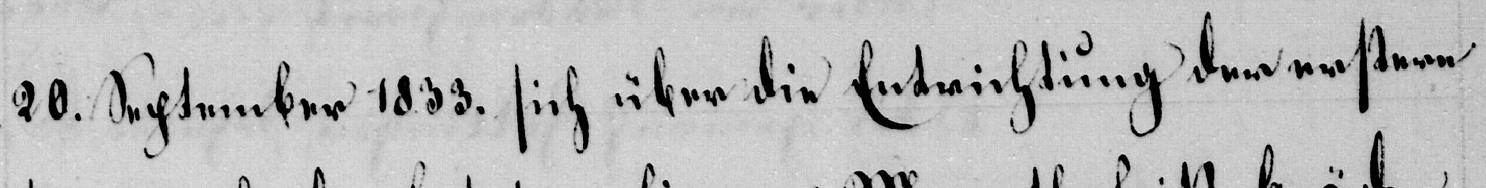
20. September 1833. sich über die Entrichtung der erstern
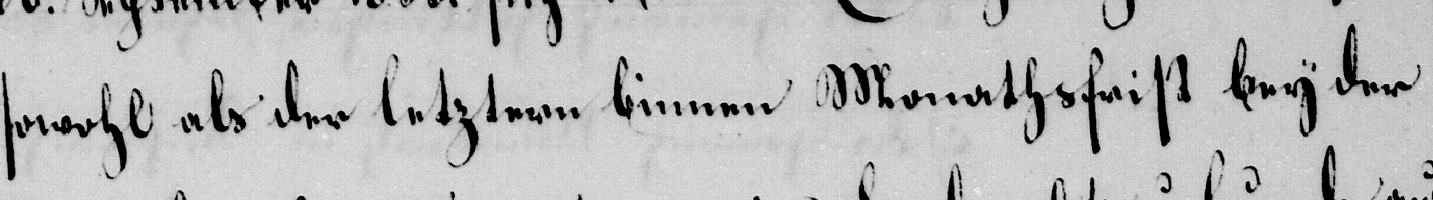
sowohl als der letztern binnen Monathsfrist bey der
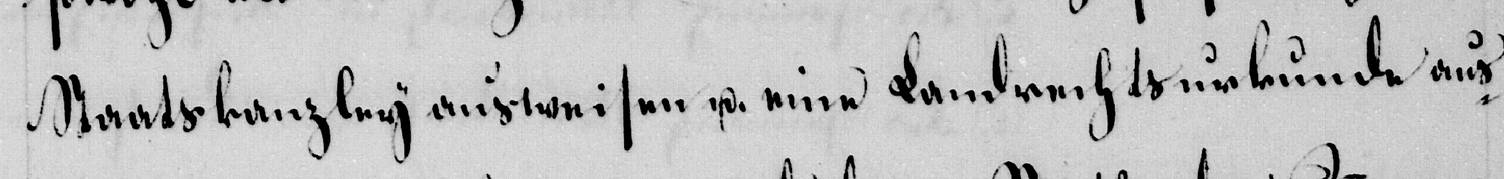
Staatskanzley ausweisen u. eine Landrechtsurkunde aus¬
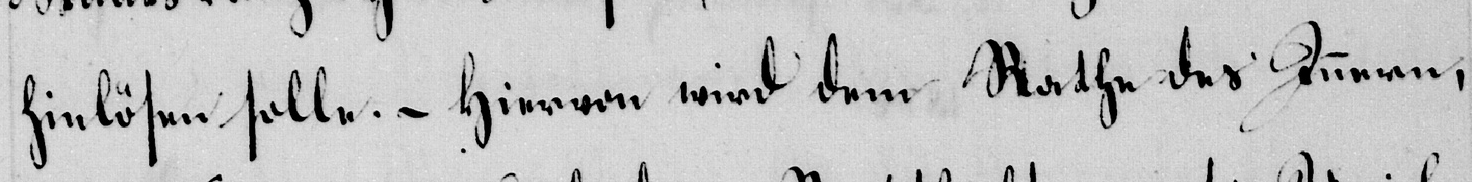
hinlösen solle. – Hiervon wird dem Rathe des Innern,
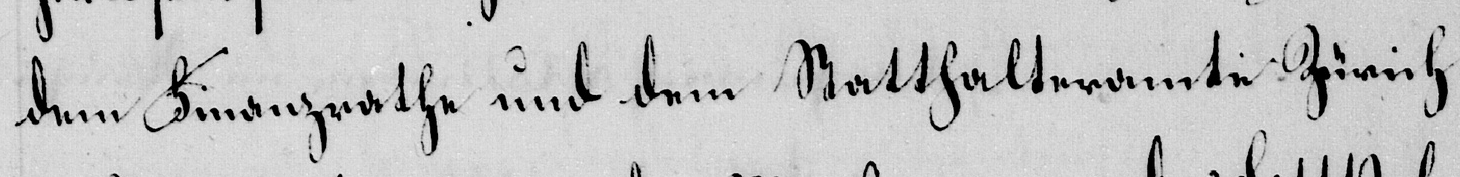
dem Finanzrathe und dem Statthalteramte Zürich
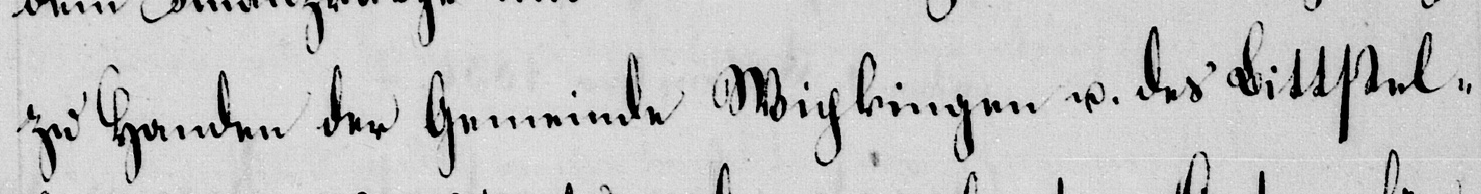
zu Handen der Gemeinde Wipkingen u. des Bittstel¬
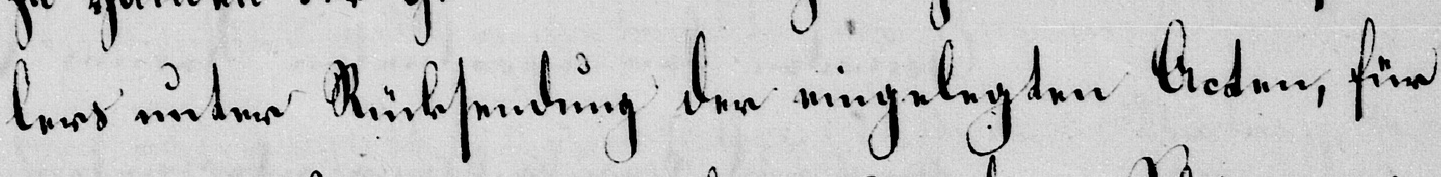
lers unter Rücksendung der eingelegten Acten, für
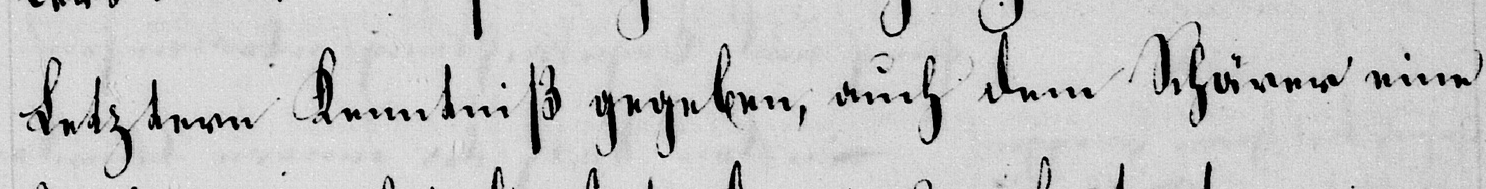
Letztern Kenntniß gegeben, auch dem Schärer eine
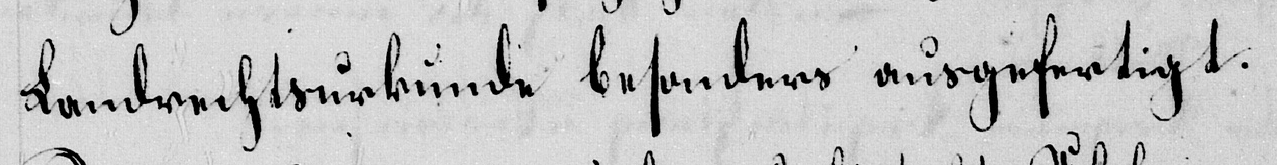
Landrechtsurkunde besonders ausgefertigt.
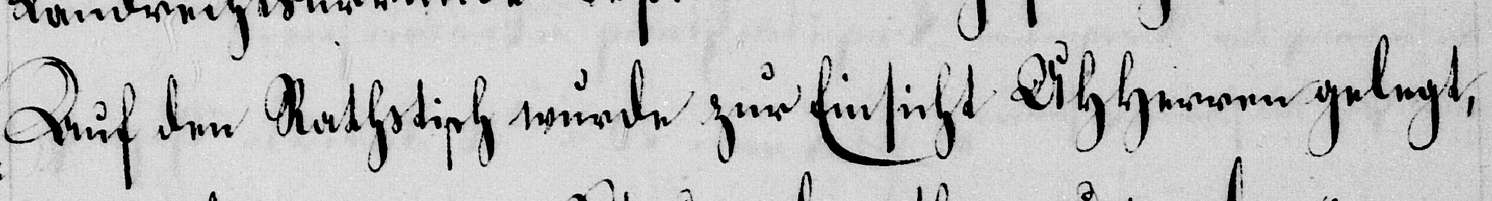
Auf den Rathstisch wurde zur Einsicht UHHerren gelegt,
